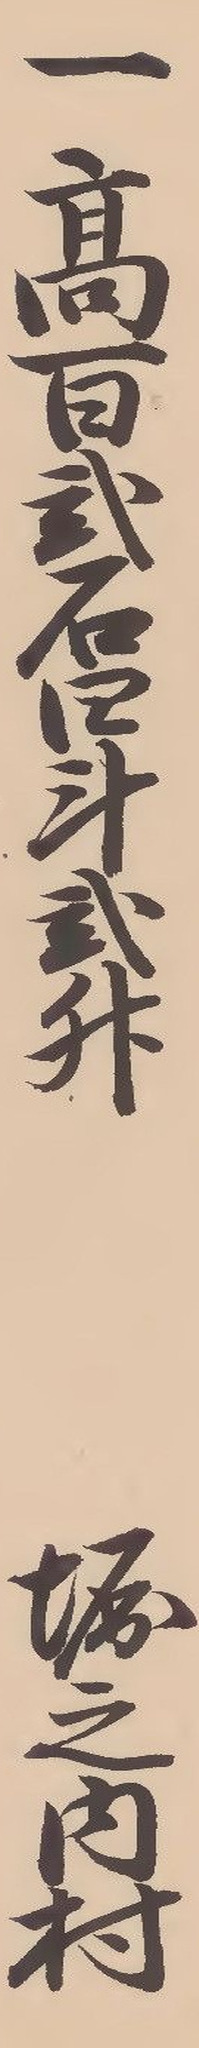一高百弐石四斗弐升堀之内村
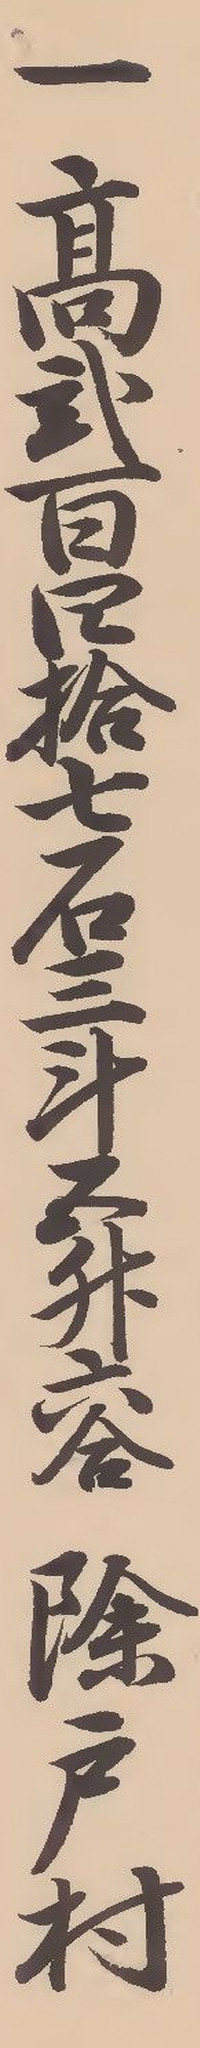一高弐百四拾七石三斗五升六合除戸村
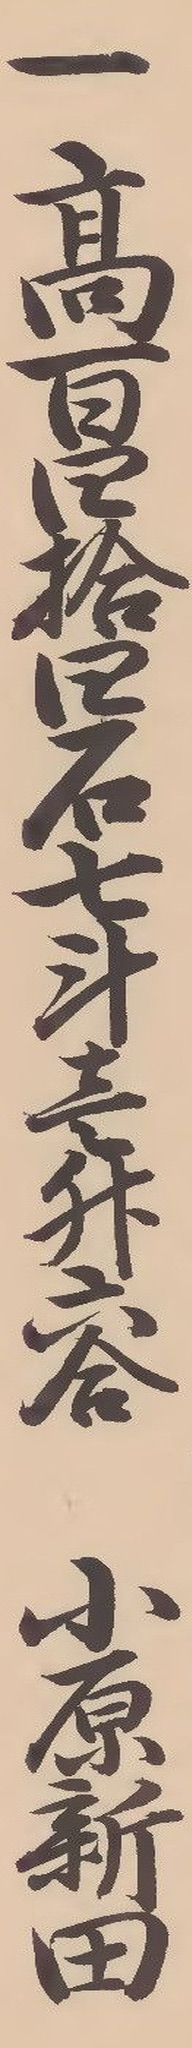一高百四拾四石七斗壱升六合小原新田

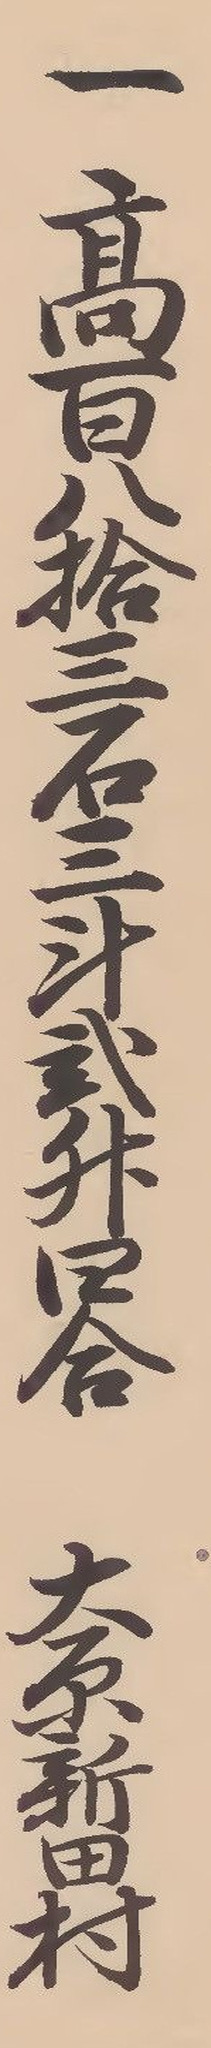一高百八拾三石三斗弐升四合大原新田村
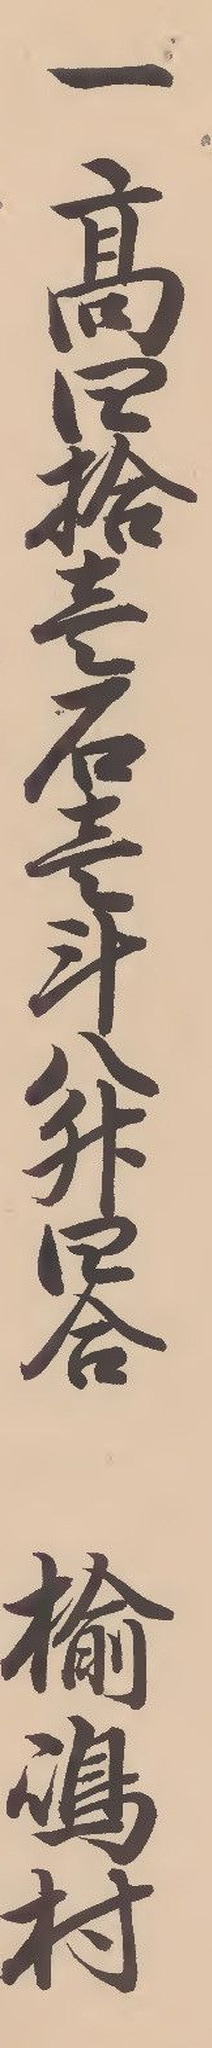一高四拾壱石壱斗八升四合楡島村
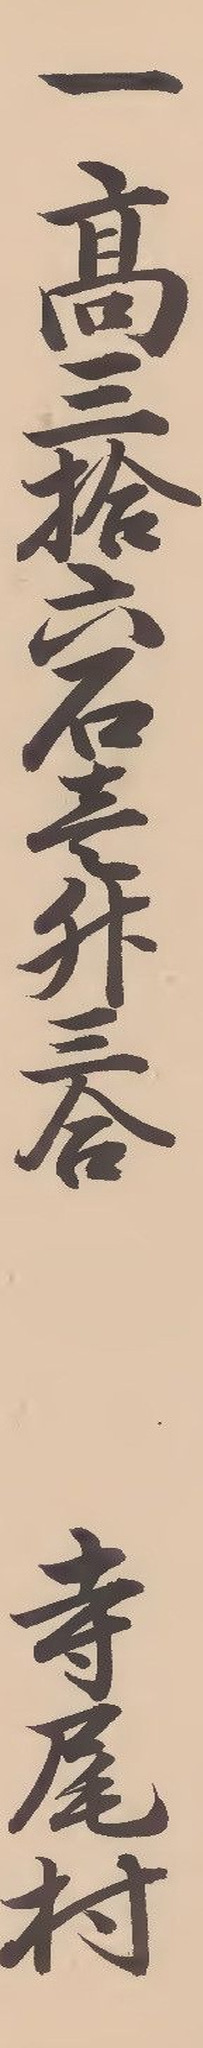一高三拾六石壱升三合寺尾村
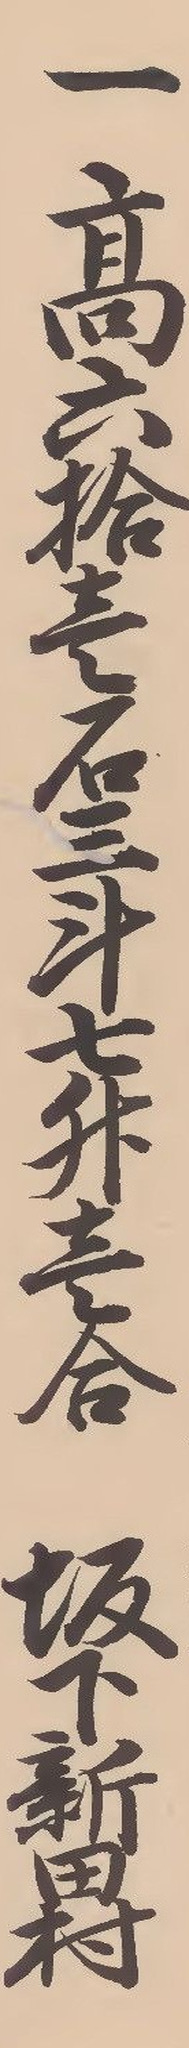一高六拾壱石三斗七升壱合坂下新田村
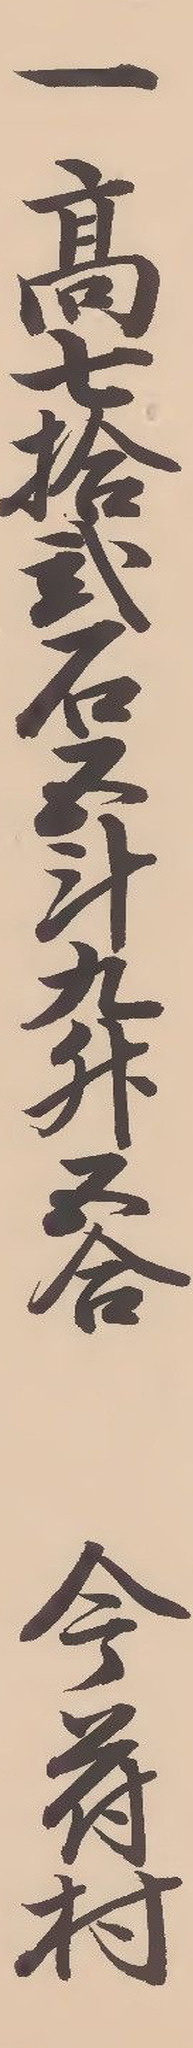一高七拾弐石五斗九升五合今府村
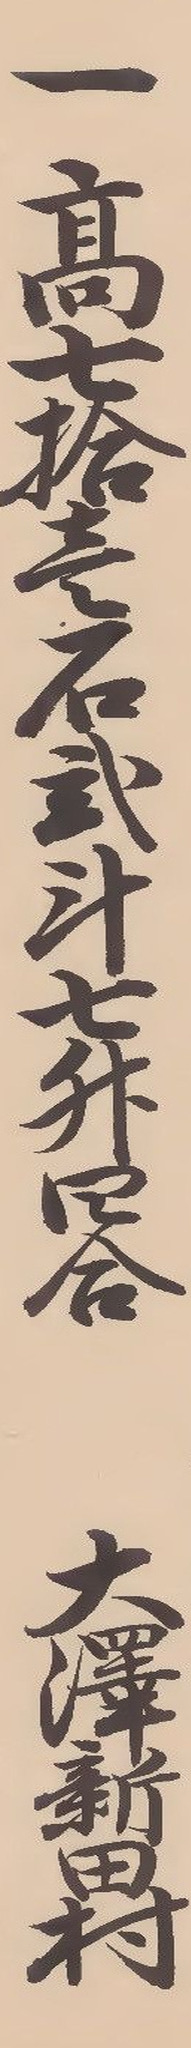一高七拾壱石弐斗七升四合大沢新田村
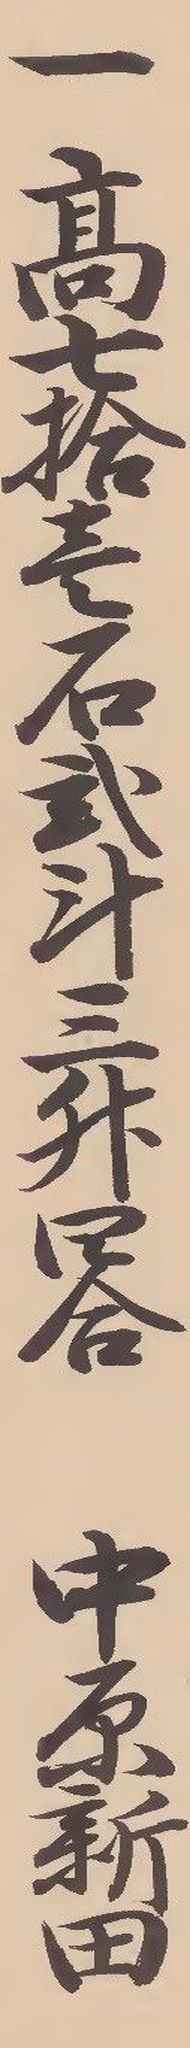一高七拾壱石弐斗三升四合中原新田

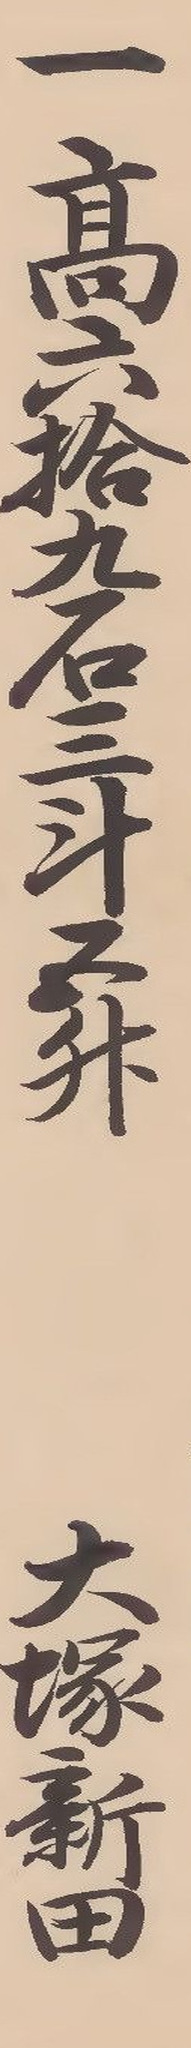一高六拾九石三斗五升大塚新田
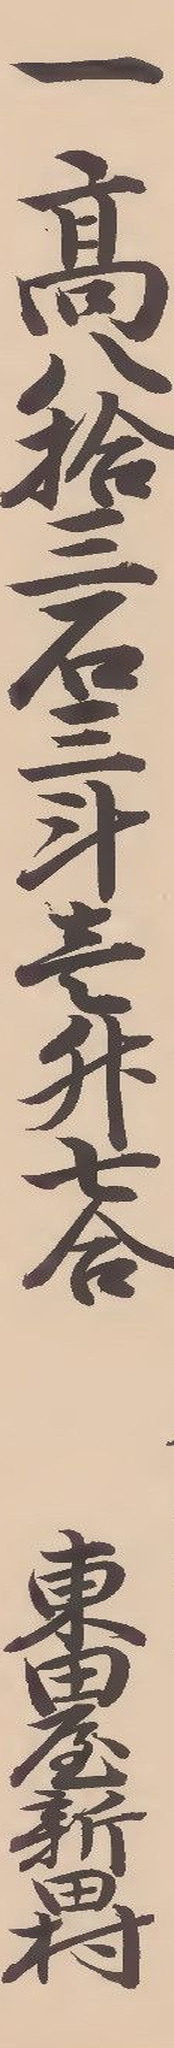一高八拾三石三斗壱升七合東田屋新田村
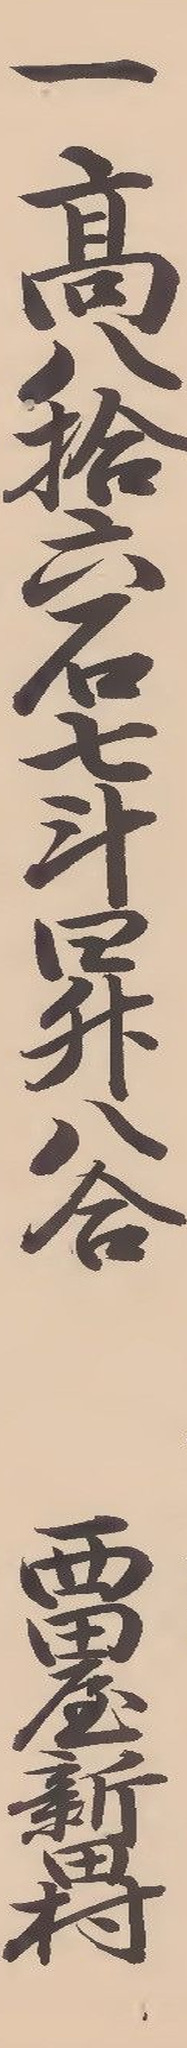一高八拾六石七斗四升八合西田屋新田村
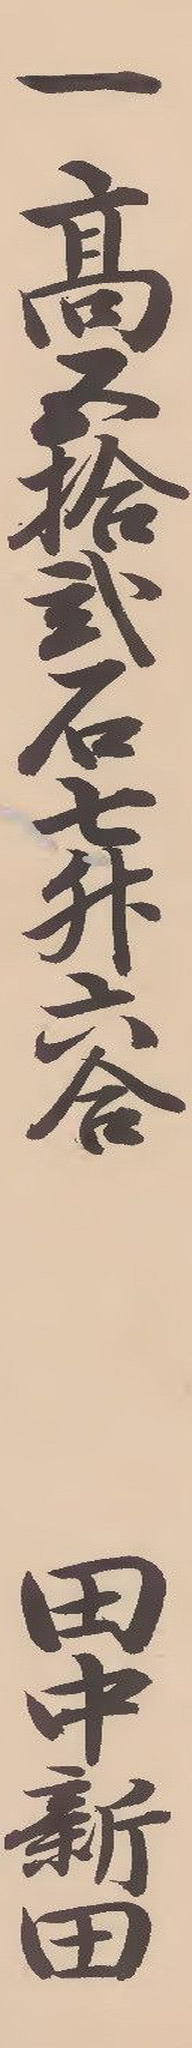一高五拾弐石七升六合田中新田
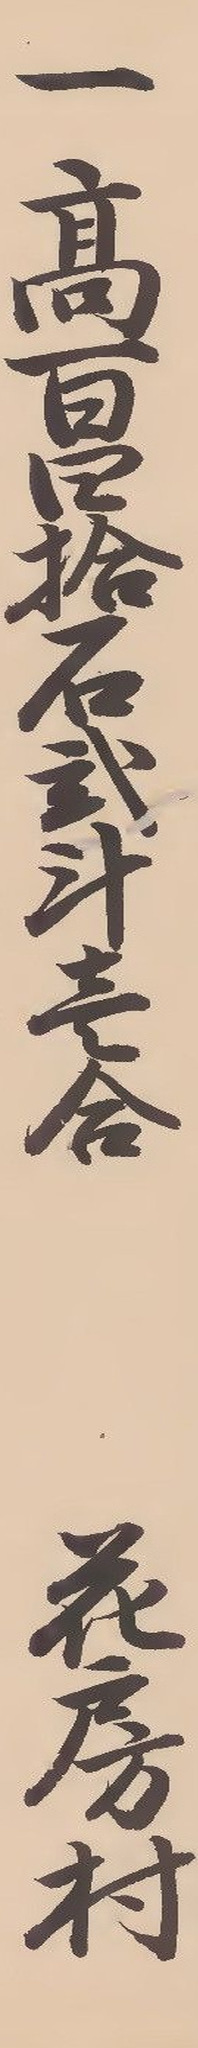一高百四拾石弐斗壱合花房村
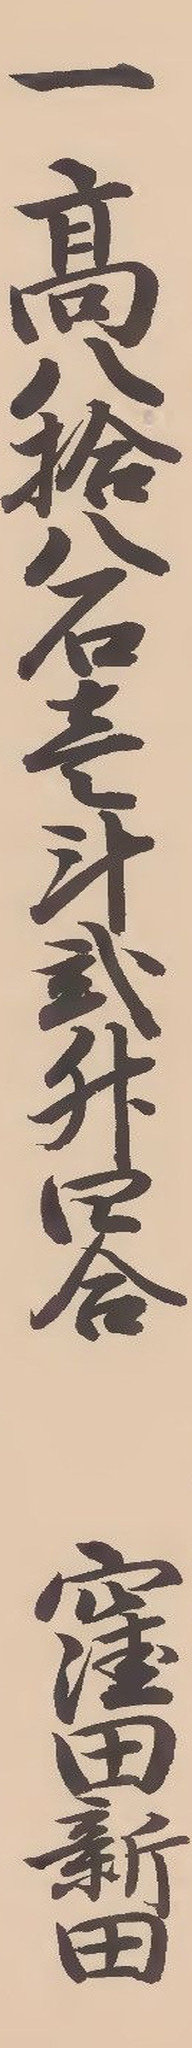一高八拾八石壱斗弐升四合窪田新田
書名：越後国郷帳　上
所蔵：国立公文書館 National Archives of Japan
